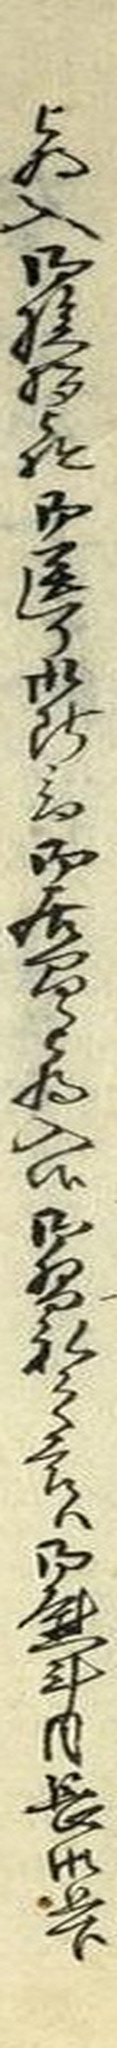被為入御挨拶被遊御送り御断ニ而御居間へ被為入候御習礼之節ハ御熨斗目長御上下
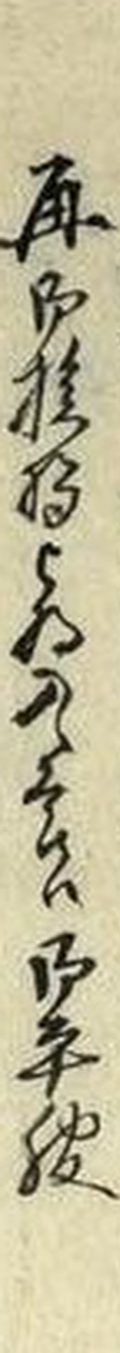再御挨拶被為入候節ハ御平服
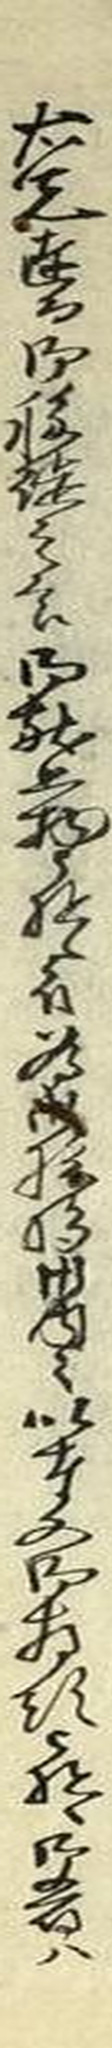右先達而御移徒之節御献上物被遊候ニ付為御挨拶御内々以奉文御拝領被遊候御肴ハ
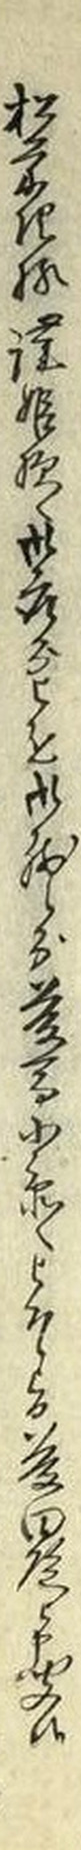松栄院様謹姫様へ御取分被進御残之分藤馬小兵衛へ被下候旨藤田殿被申聞候
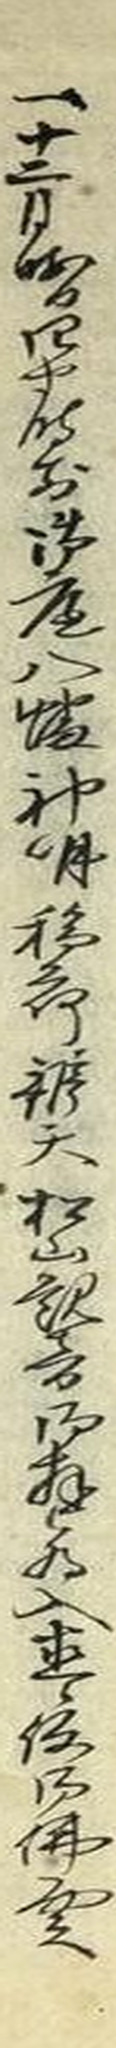一十二月晦日四半時前御庭八幡神明稲荷弁天松山観音御拝被為入直ニ仮御仏殿
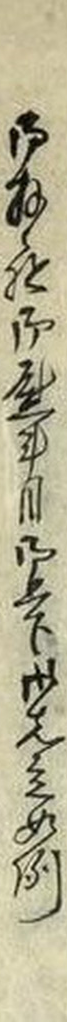御拝被遊御熨斗目御上下御先立如例
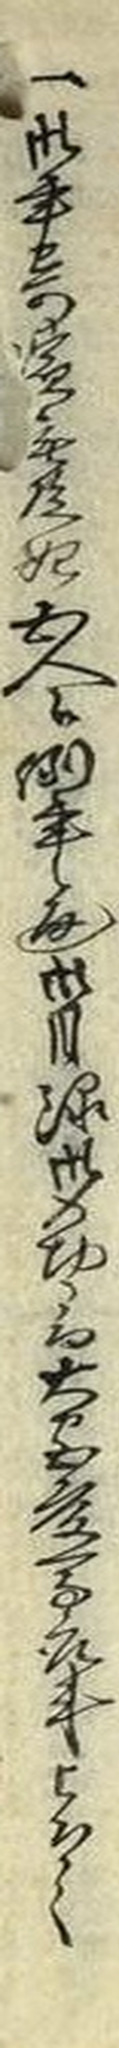一御年寄浜尾殿始五人江例年之通御目録御〆切ニ而大宮藤馬取計被下之
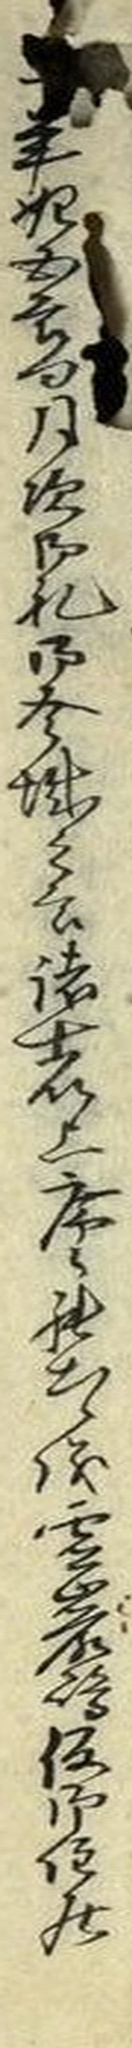一年始五節句月次御礼御登城之節諸士以上席々罷出候儀霊厳嶋仮御住居

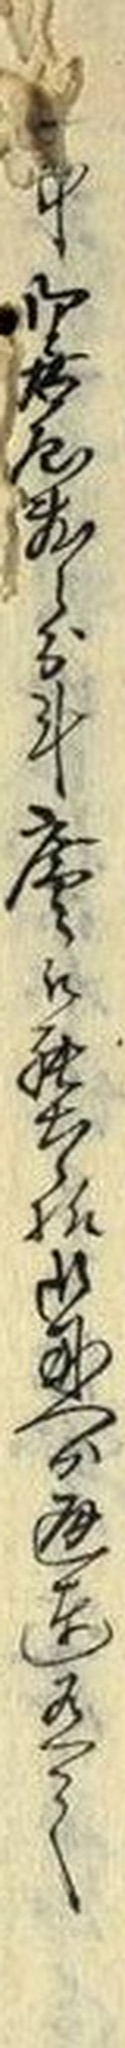中御居屋敷之分斗席々江罷出候様御用人ゟ通達有之
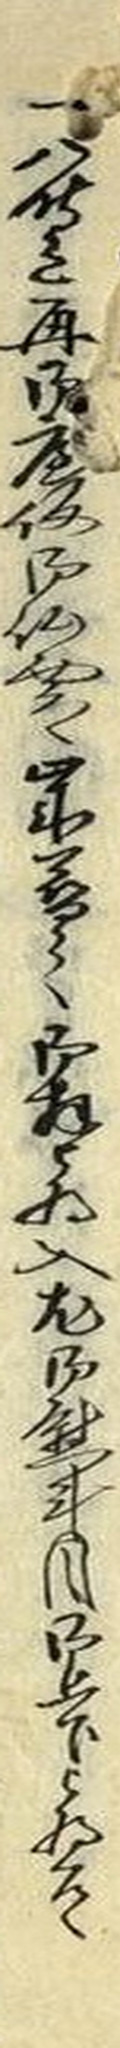一八時過再御庭仮御仏殿へ歳暮之御拝被為入尤御熨斗目御上下被為召候
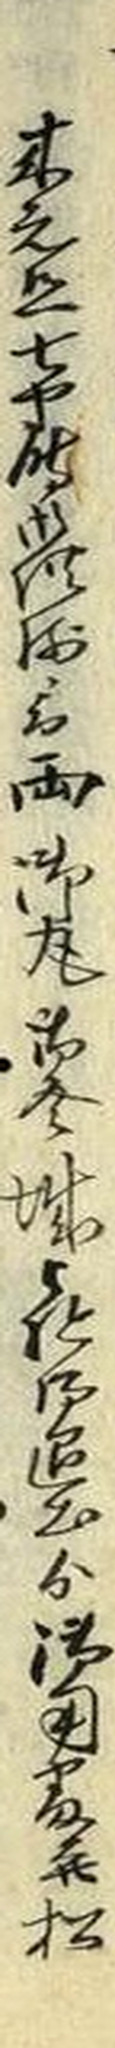来元旦七半時御供揃ニ而両御丸御登城被遊御退出ゟ御用番幷松
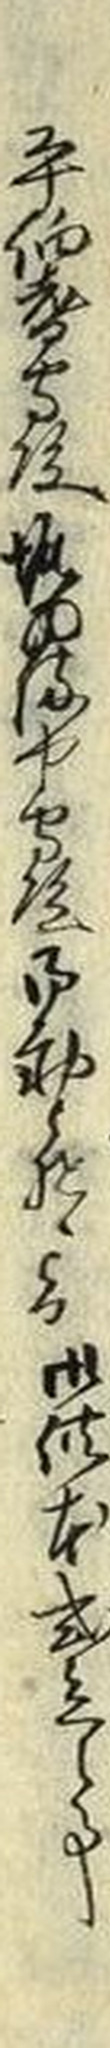平伯耆守殿堀田備中守殿御勤被遊候旨御供本式立之事
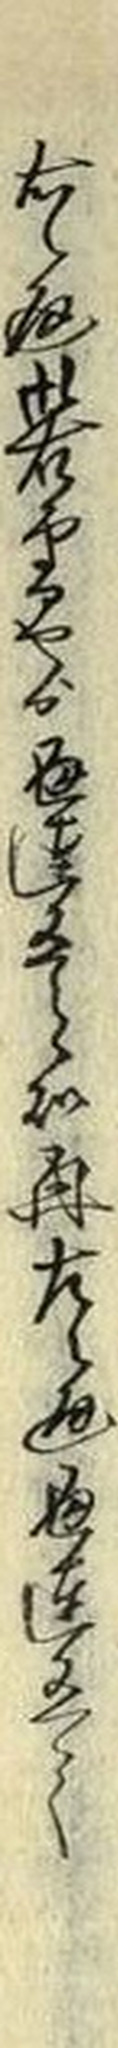右之通御右筆部屋ゟ通達有之候処再左之通通達有之
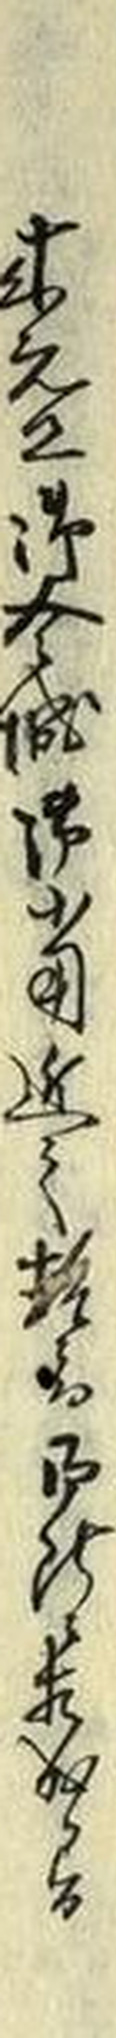来元旦御登城御小用近之趣ニ而御断ニ相成候旨
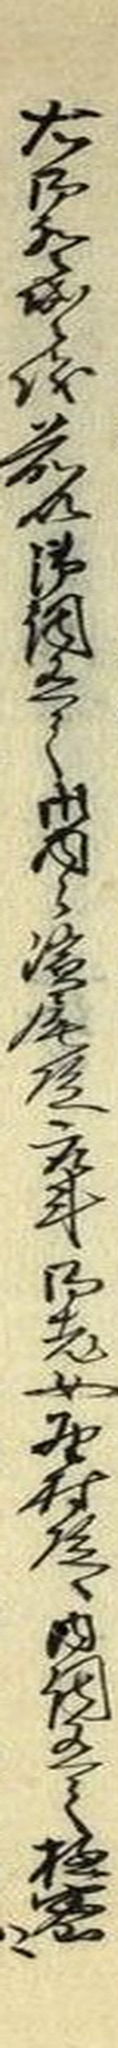右御登城之儀前以御調有之御内々浜尾殿取計御老女野村殿へ内調有之極密
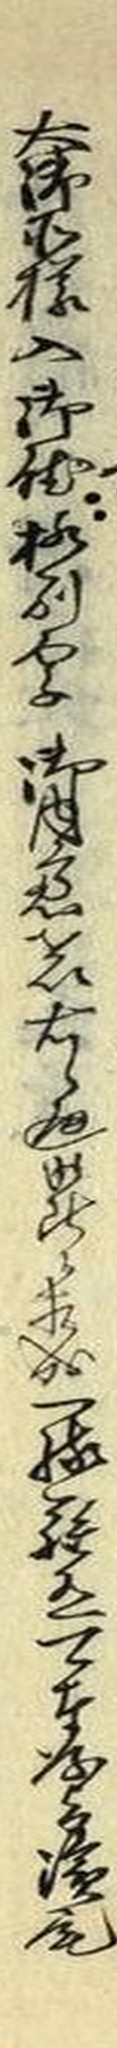大御所様入御聴格別厚御内慮を以右之通御断ニ相成一統難有可奉存旨浜尾
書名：少傅日録抄（斉善付側向頭取日記、在府）
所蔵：福井県文書館 Fukui Prefectural Archives
